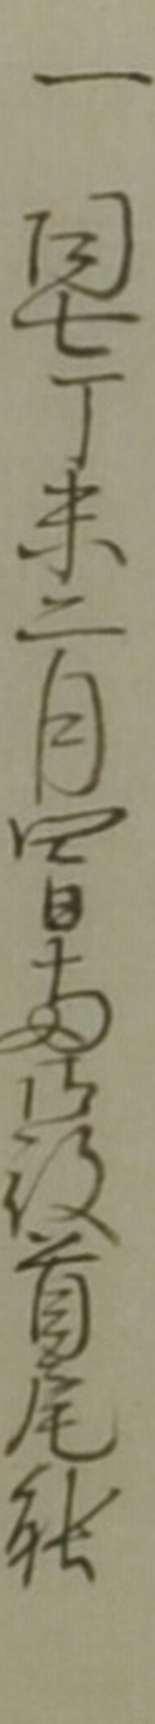一同七丁未二月四日両御役首尾能
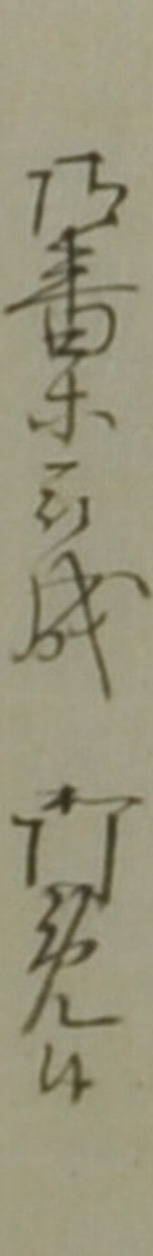御番等被成御免候
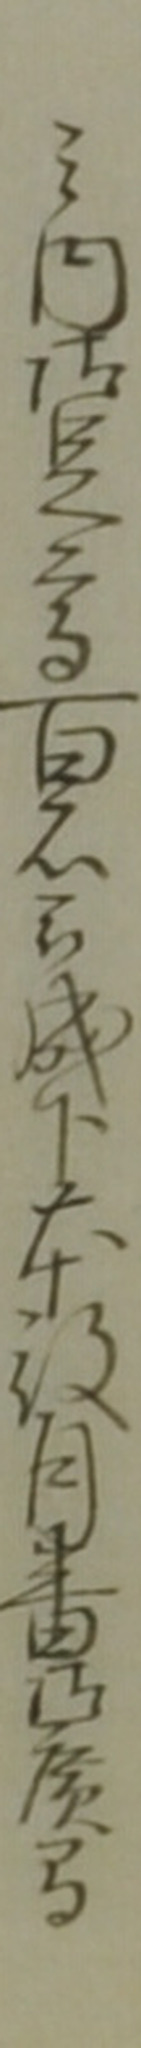之内御足高百石被成下本役月番御広間
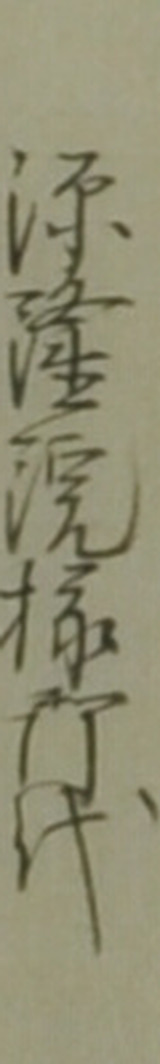源隆院様御代
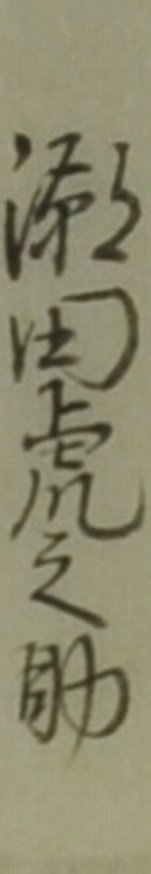潮田虎之助
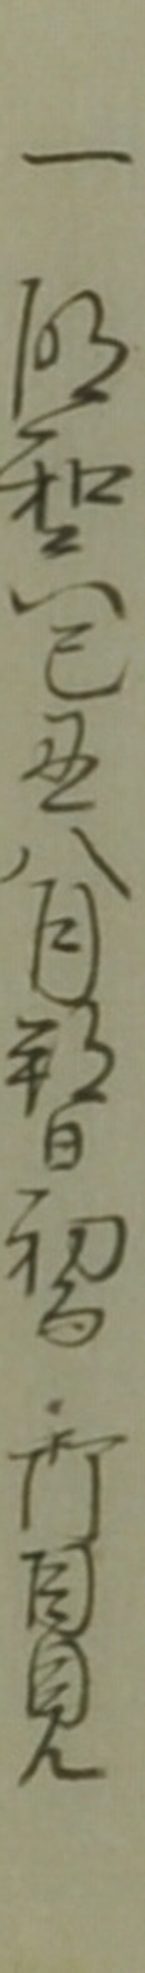一明和六己丑八月朔日初而御目見
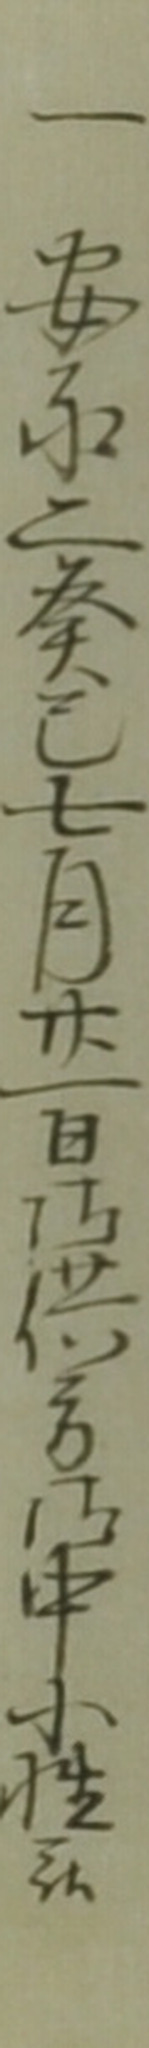一安永二癸巳七月廿一日御供方御中小性被
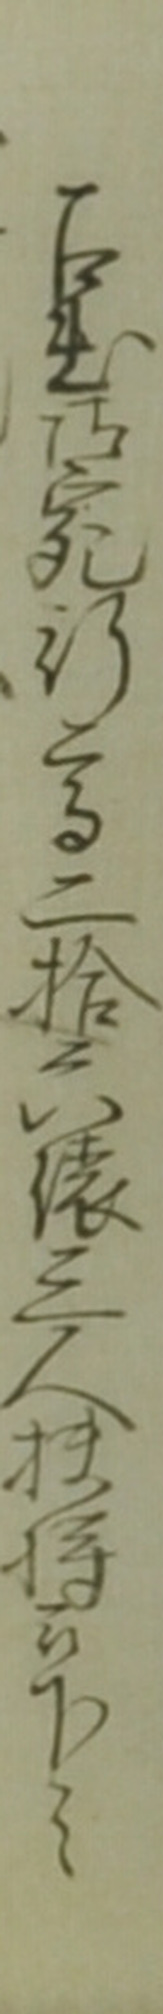召出御宛行高二拾六俵三人扶持被成下
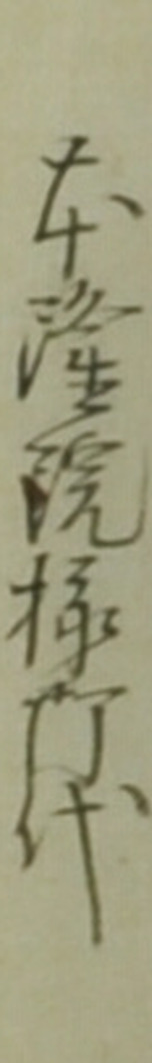本隆院様御代

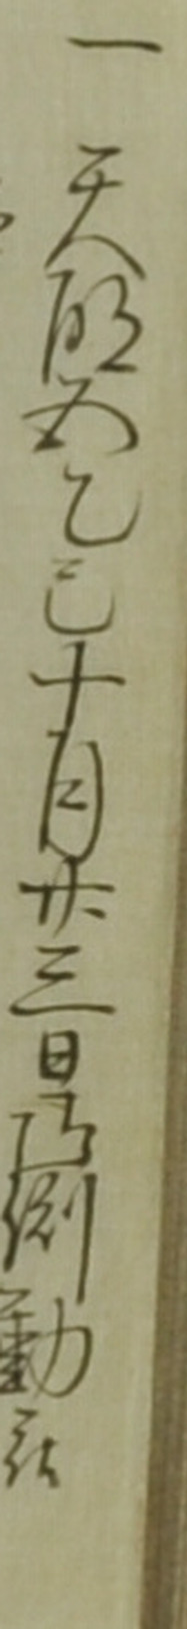一天明五乙巳十月廿三日御側勤被
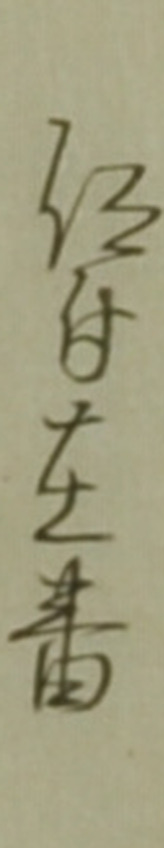仰付在番
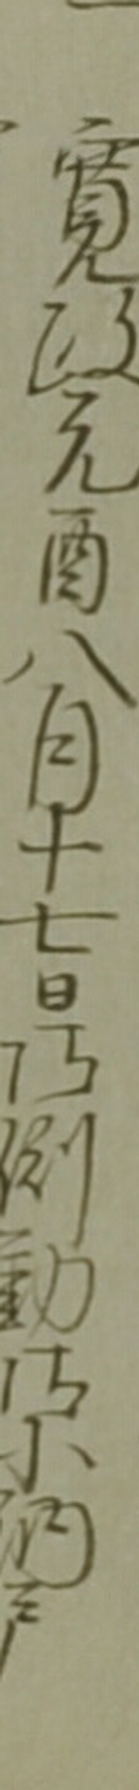一寛政元酉八月十七日御側勤御小納戸
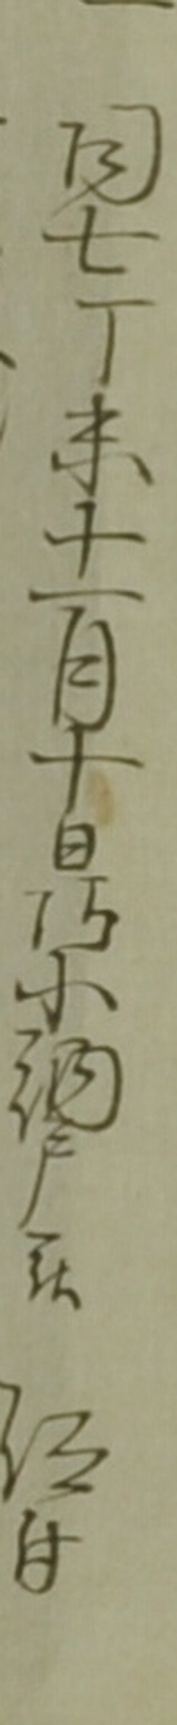一同七丁未十一月十日御小納戸被仰付
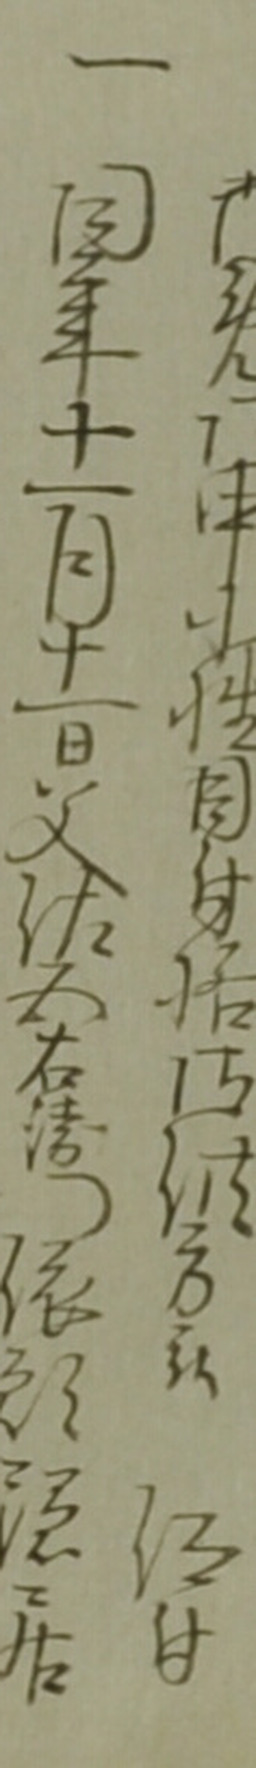一同年十一月十一日父佐五右衛門依願隠居
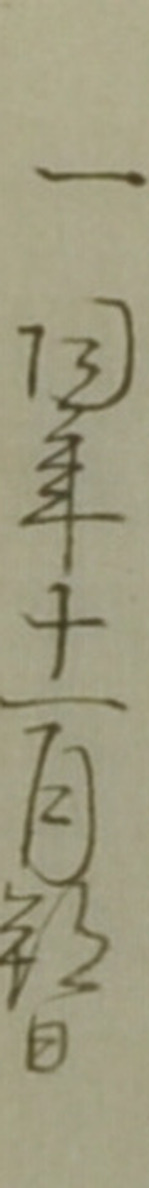一同年十一月朔日
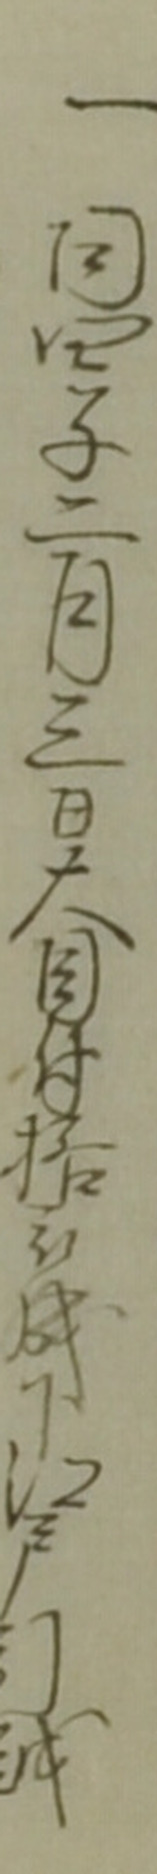一同四子二月三日大目付格被成下江戸引越
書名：給人諸士勤仕録（三）
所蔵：伊那市立高遠町図書館・合同会社AMANE
